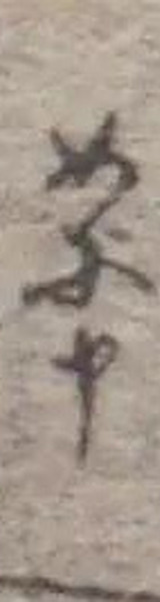めに申
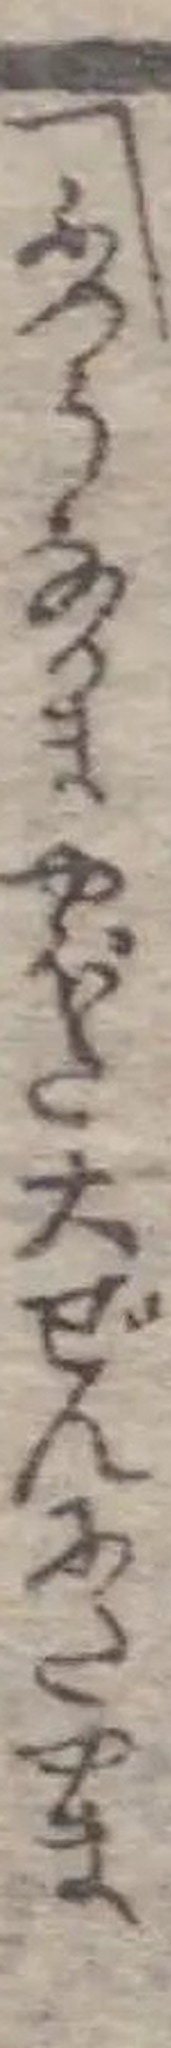〽ふつうなかまやぼた大ぜんにたやま
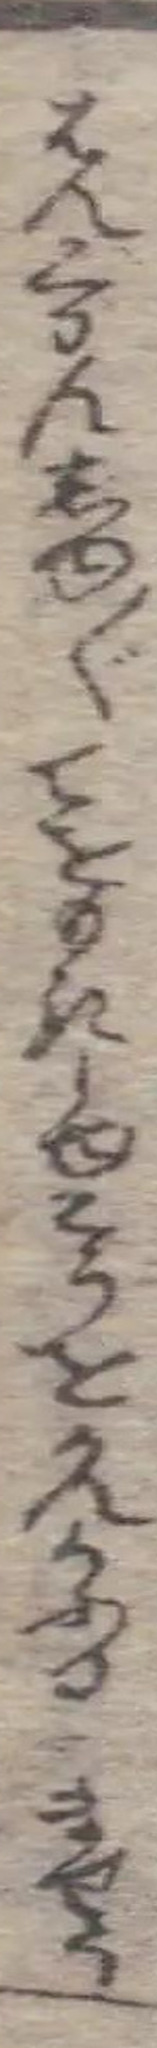はんくわんしゆ〴〵てをもきしゆこうをかんかふる

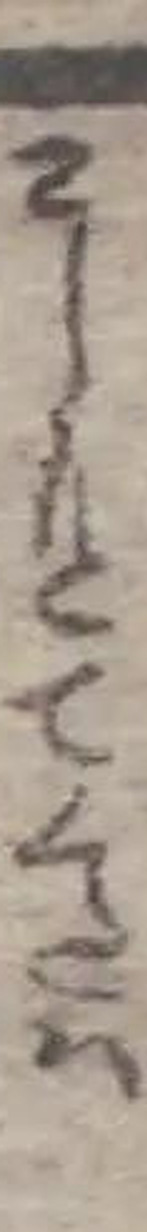こしもとてくだは
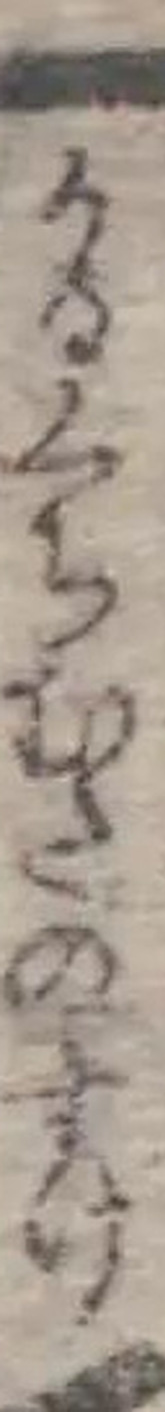かるくちむだのすけ
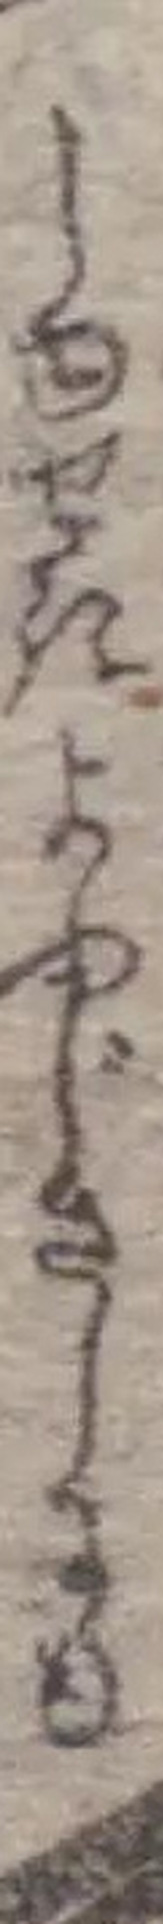しゆせきよふじさしにも
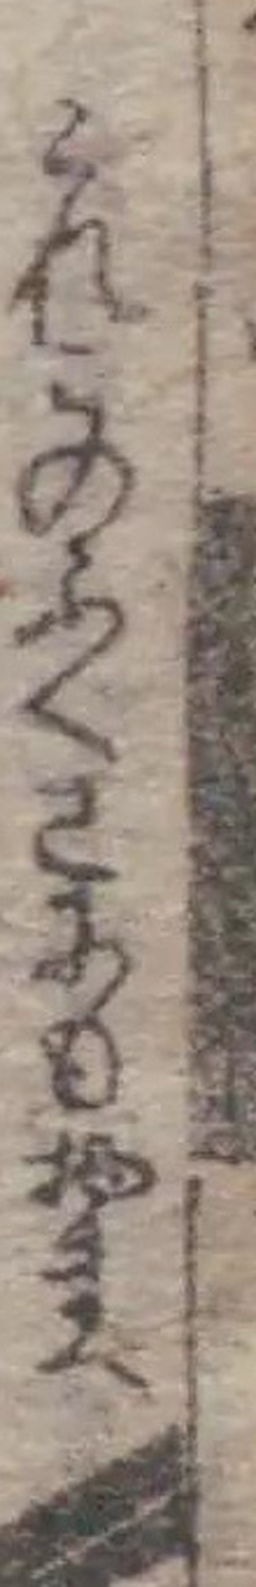これこのふくさにもおまへの
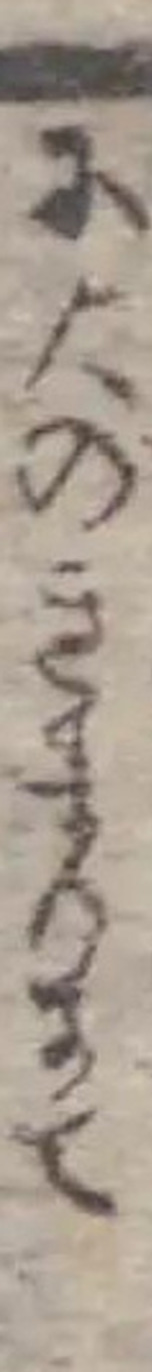に人のきまりにて
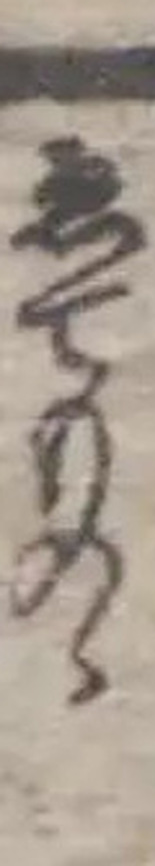ゑてものゝ
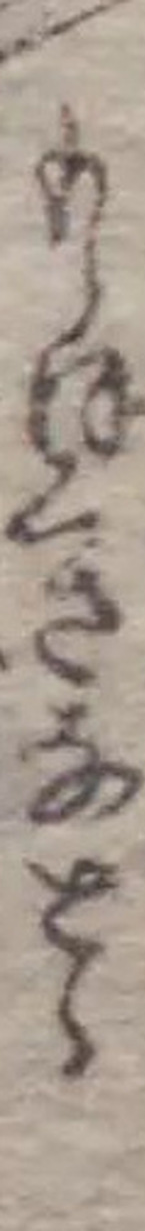もしほくさなとゝ
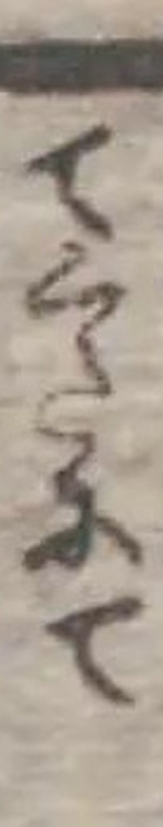てくたにて
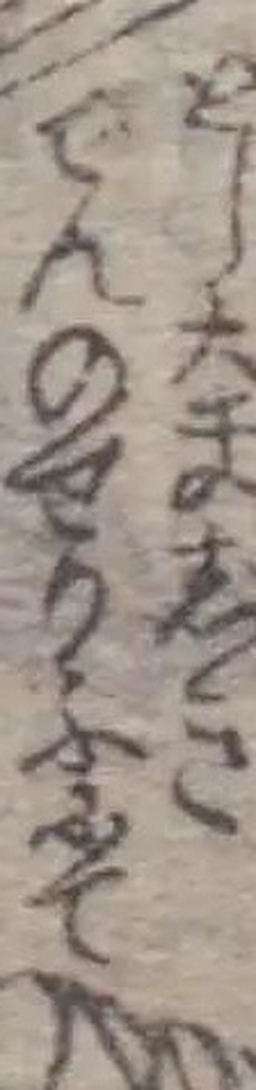でんのせりふにて
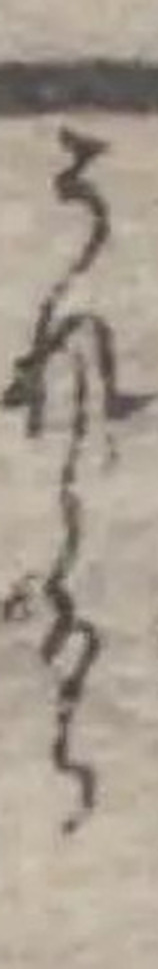うれしから
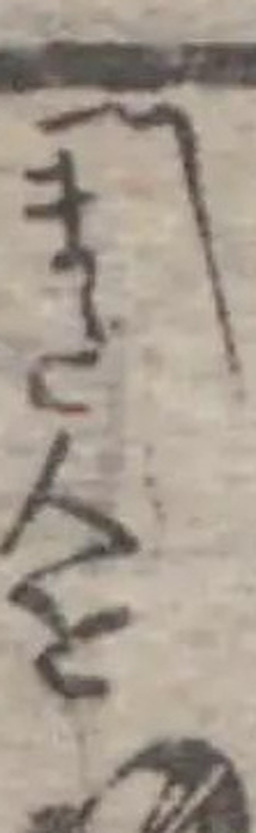〽また人を
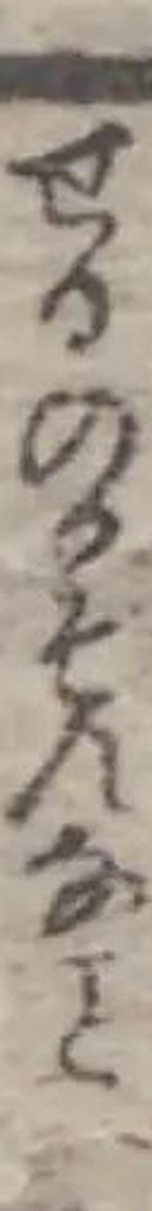せるのかそんなこと
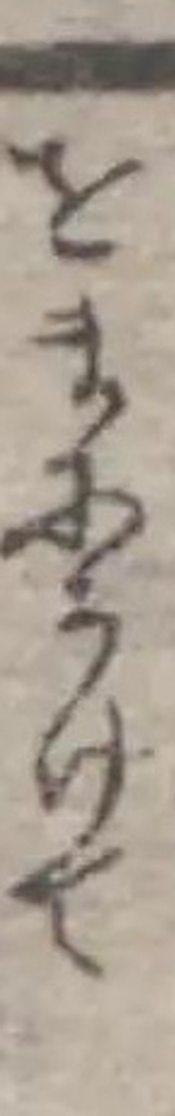をまにうけて
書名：富多高慢噺 3巻
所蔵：国立国会図書館 National Diet Library, JAPAN
